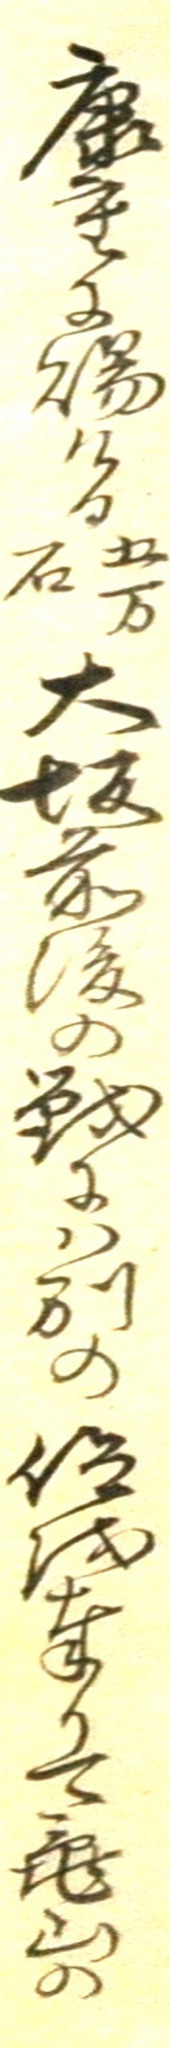康重に賜ける五万石大坂前後の戦には別の仰を奉りて亀山の

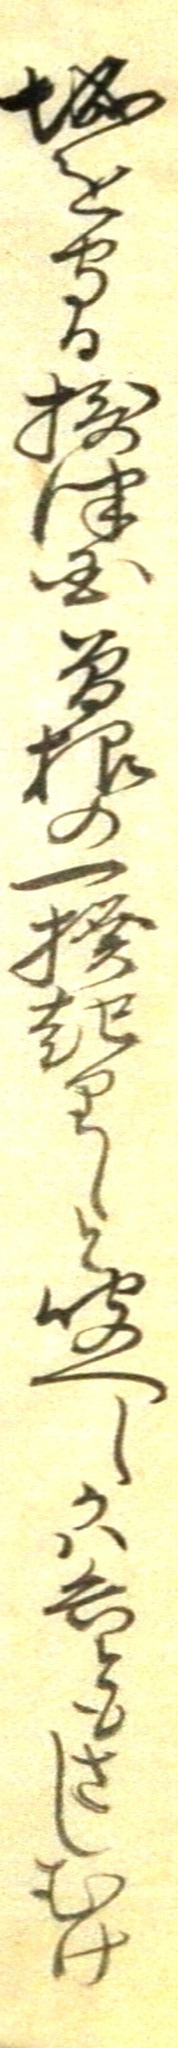城を守る摂津国曽根の一揆起りしと聞へしかは兵ともさしむけ
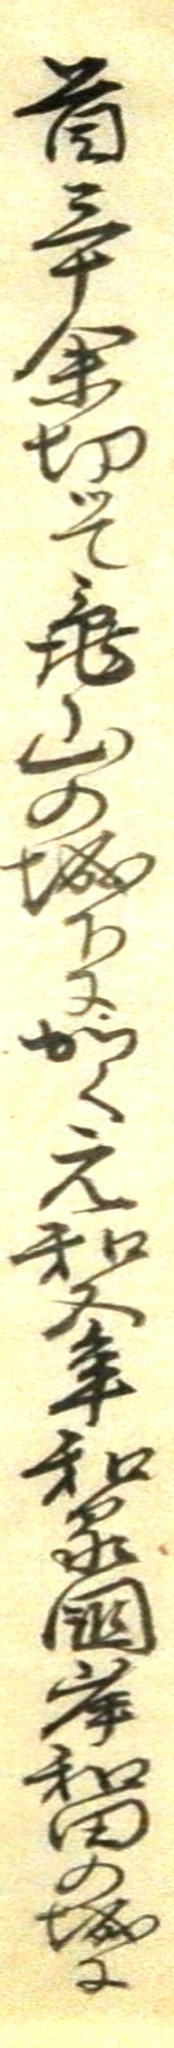首三十余切ッて亀山の城下にかく元和五年和泉国岸和田の城に
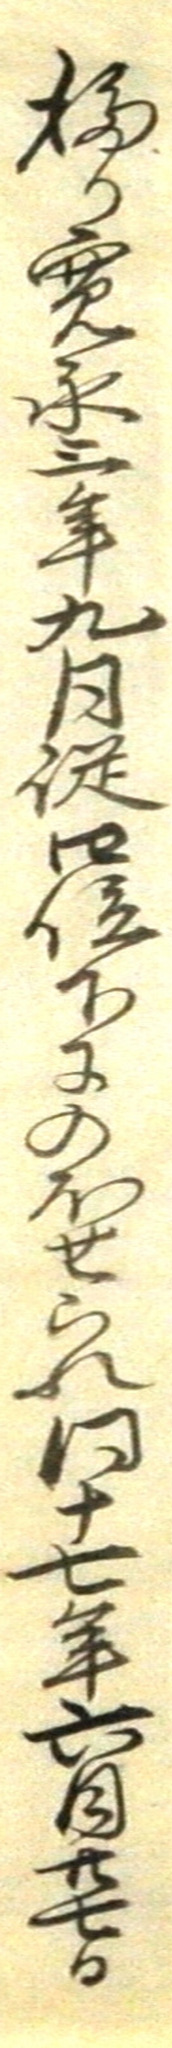移り寛永三年九月従四位下にのほせられ同十七年六月廿七日
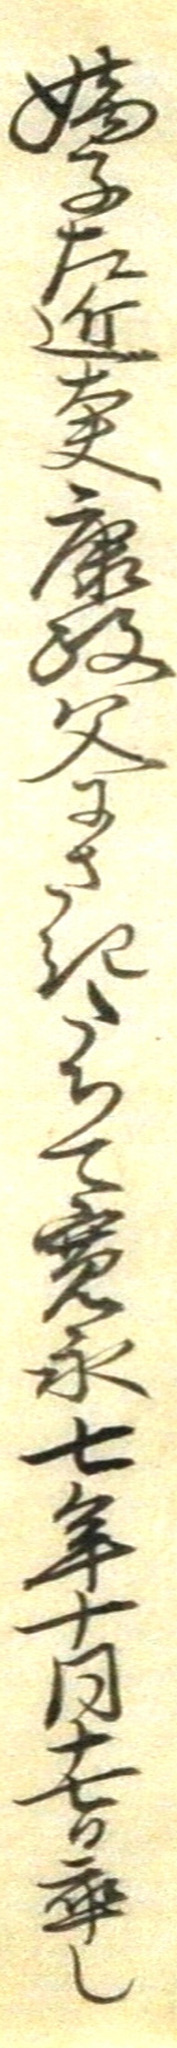嫡子左近大夫康政父にさきたちて寛永七年十月十七日卒し
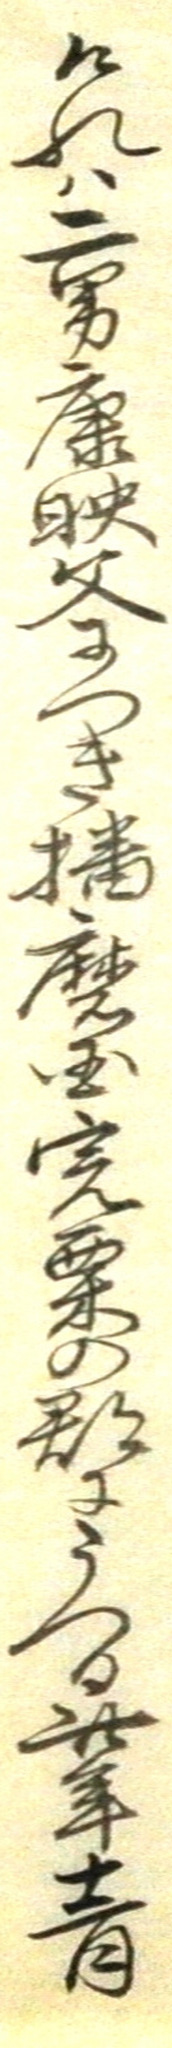けれは二男康映父につき播磨国宍粟の郡にうつる廿年十二月
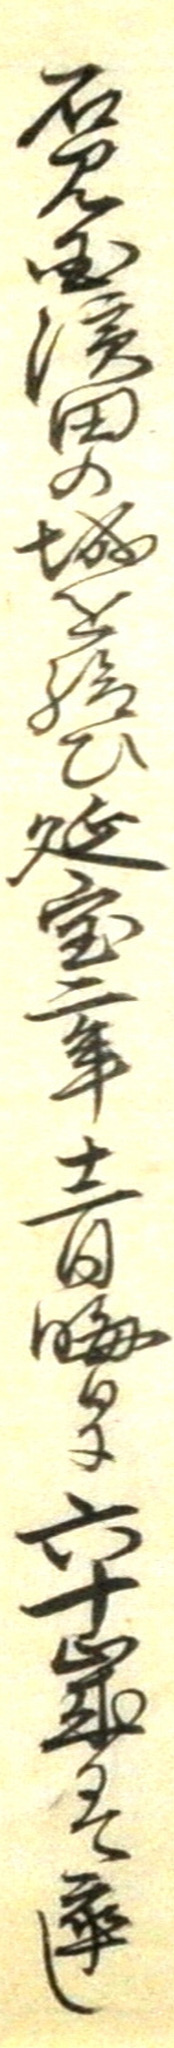石見国浜田の城を給ひ延宝二年十二月晦日に六十歳にて卒し
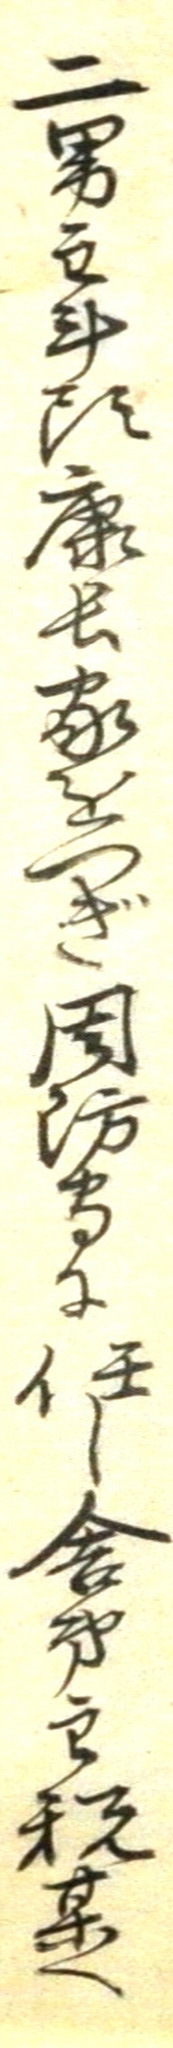二男主計頭康長家をつぎ周防守に任し舎弟主税某へ
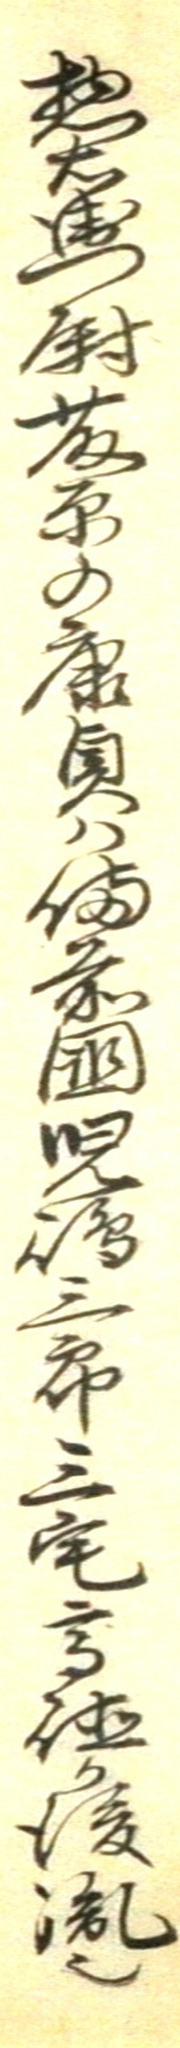惣右衛門尉藤原の康貞は備前国児島三郎三宅高徳か後胤也
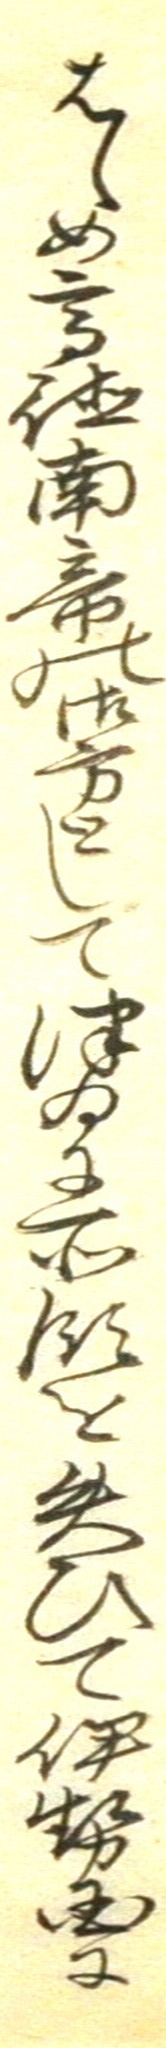はしめ高徳南帝の御方としてつゐに所領を失ひて伊勢国に
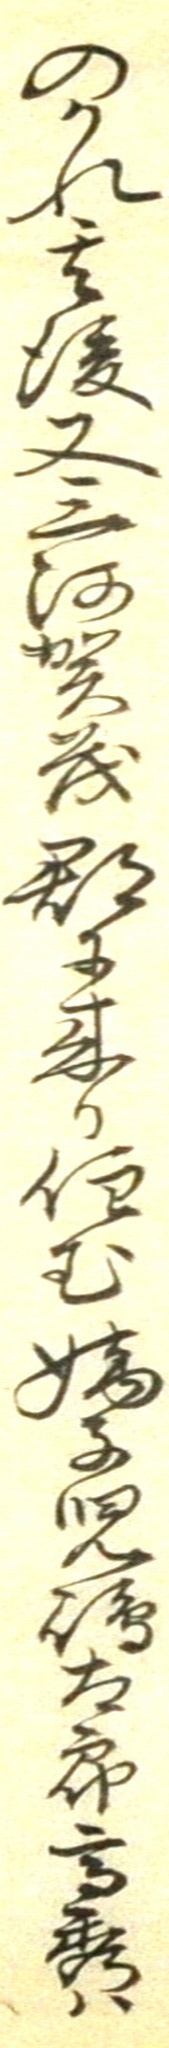のかれ其後又三河賀茂郡に来り住む嫡子児島太郎高秀は
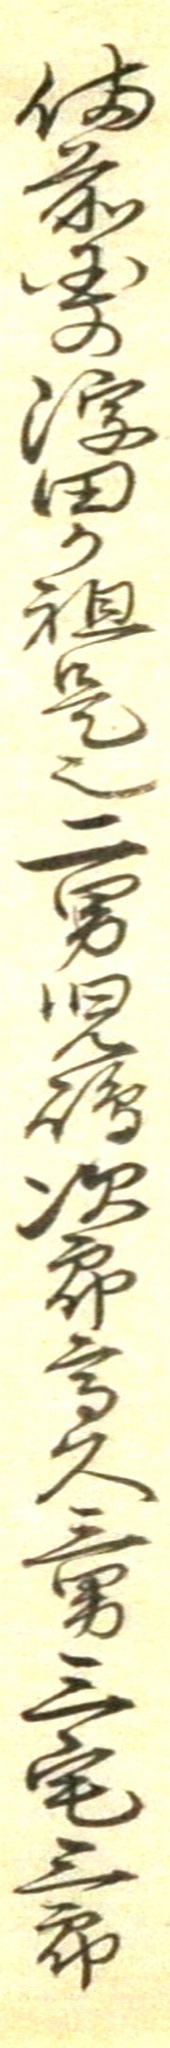備前国の浮田か祖是也二男児島次郎高久三男三宅三郎
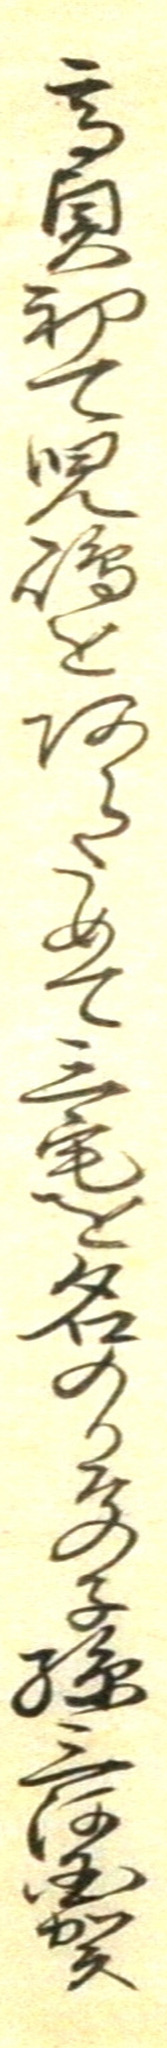高貞初て児島をあらためて三宅を名のりその子孫三河国賀
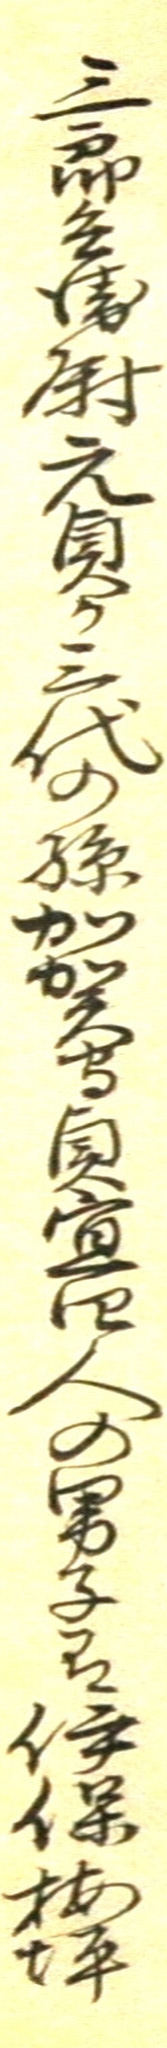三郎兵衛尉元貞か三代の孫加賀守貞宣四人の男子有伊保梅坪

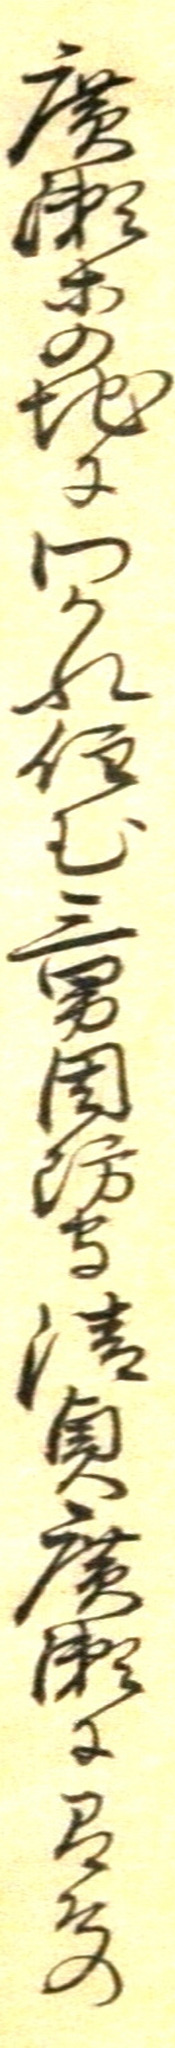広瀬等の地にわかれ住む三男周防守清貞広瀬に有その
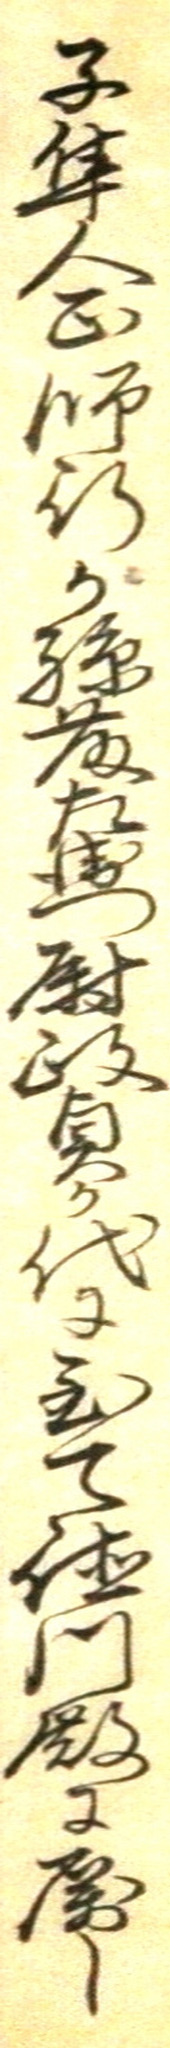子隼人正師行か孫藤左衛門尉政貞か代に至て徳川殿に属し
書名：藩翰譜（四・下）
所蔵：伊那市立高遠町図書館・合同会社AMANE
